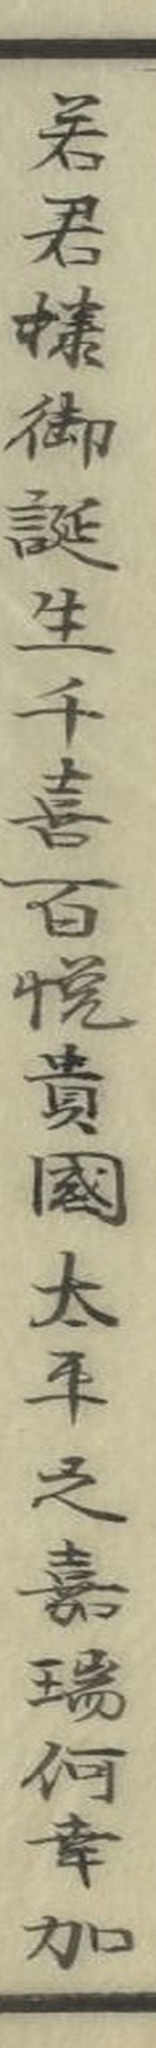若君様御誕生千喜百悦貴国太平之嘉瑞何幸加
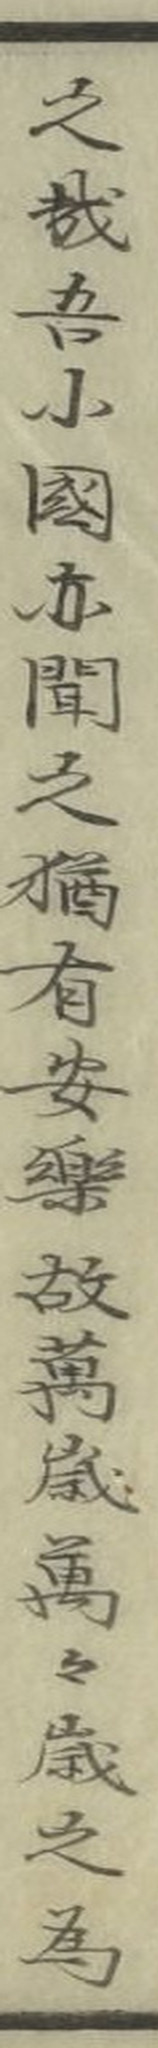之哉吾小国亦聞之猶有安楽故万歳万々歳之為
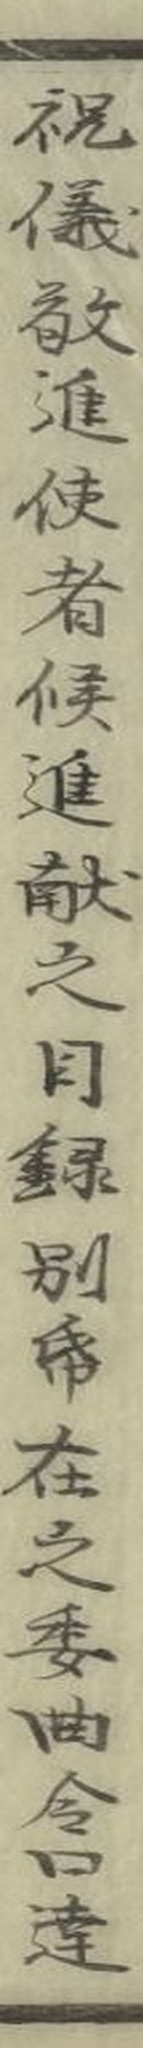祝儀敬進使者候進献之目録別紙在之委曲令口達
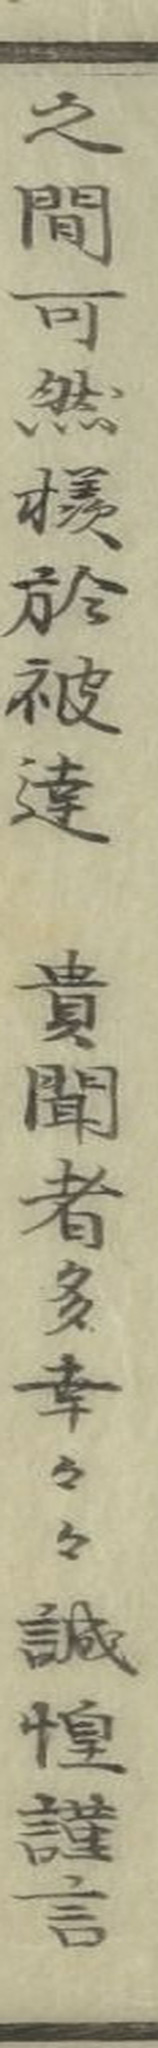之間可然様於被達貴聞者多幸々々誠惶謹言
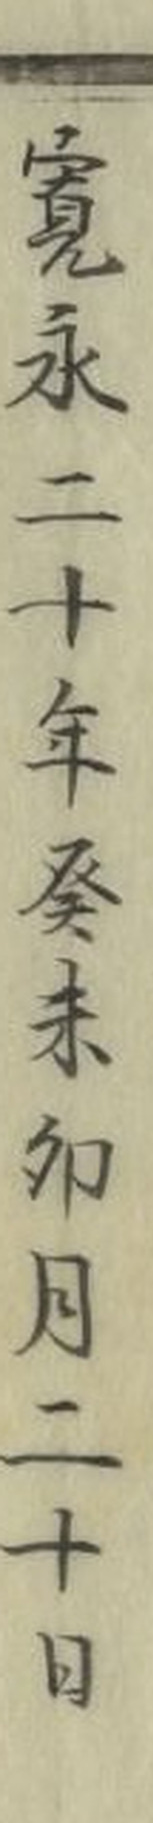寛永二十年癸未卯月二十日尚賢
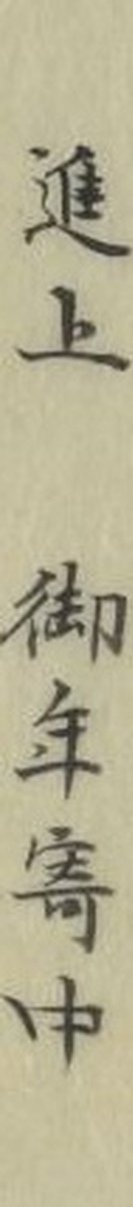進上御年寄中
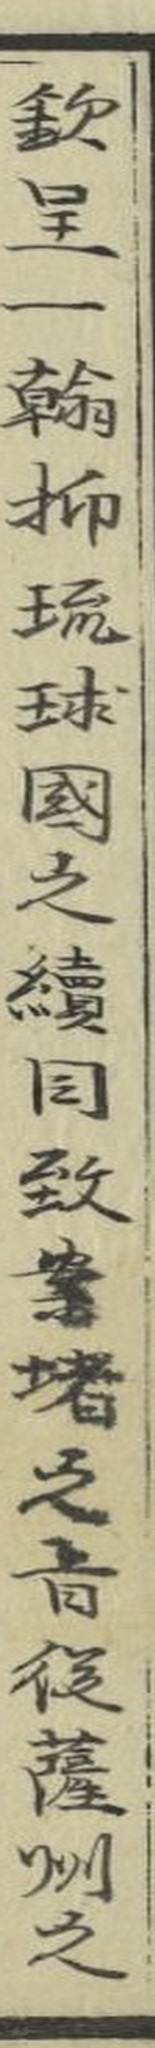欽呈一翰抑琉球国之続目致案堵之旨従薩州之
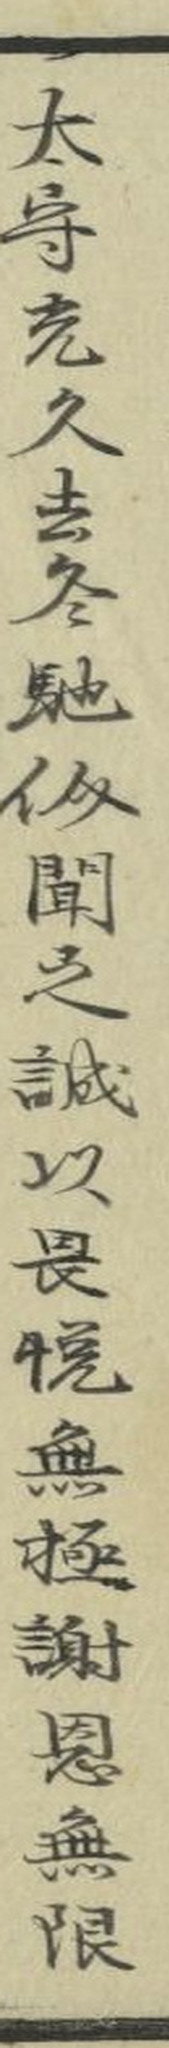太守充久去冬馳价聞之誠以畏悦無極謝恩無限
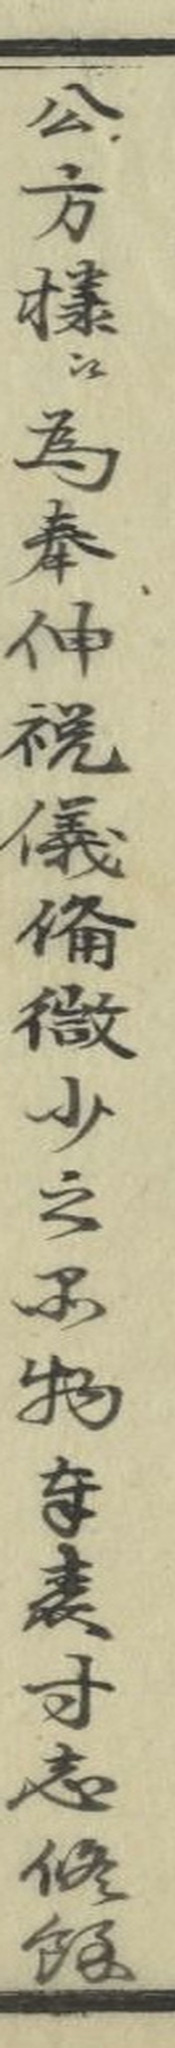公方様え為奉伸祝儀備微少之品物奉表寸志修余
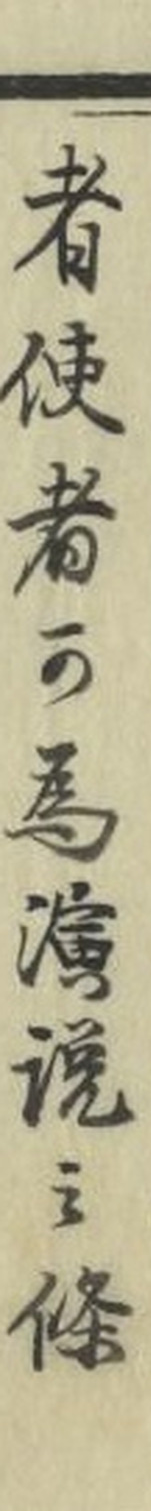者使者可為演説之條
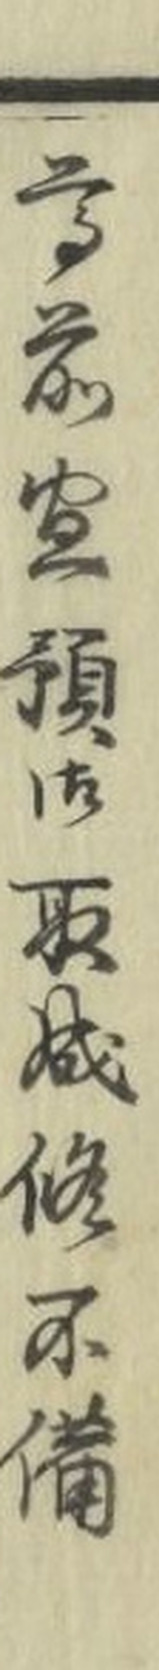高前宣預御取成修不備
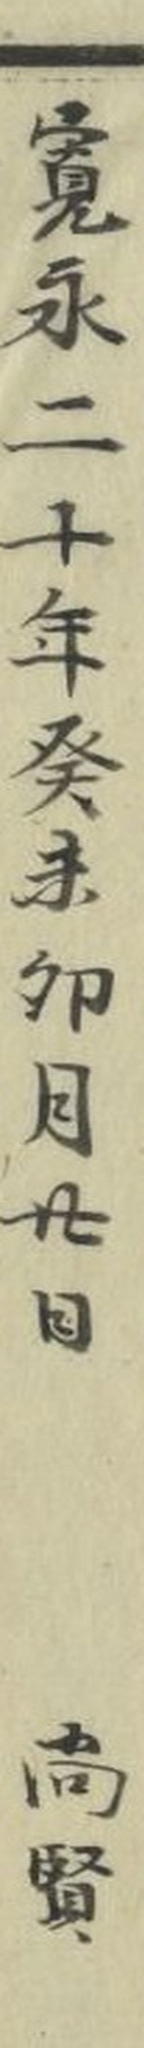寛永二十年癸未卯月廿日尚賢
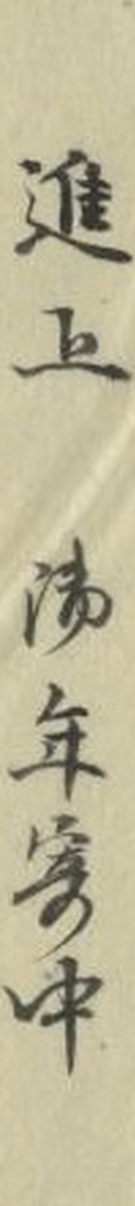進上御年寄中

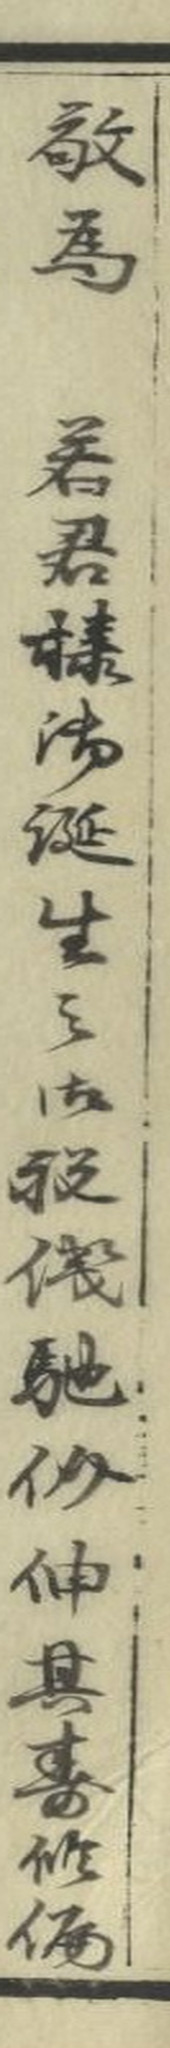敬為若君様御誕生之御祝儀馳价伸其寿候偏
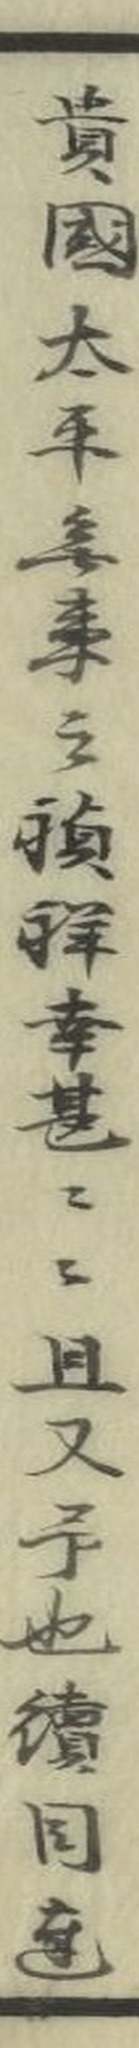貴国太平無事之禎祥幸甚々々且又予也續目達
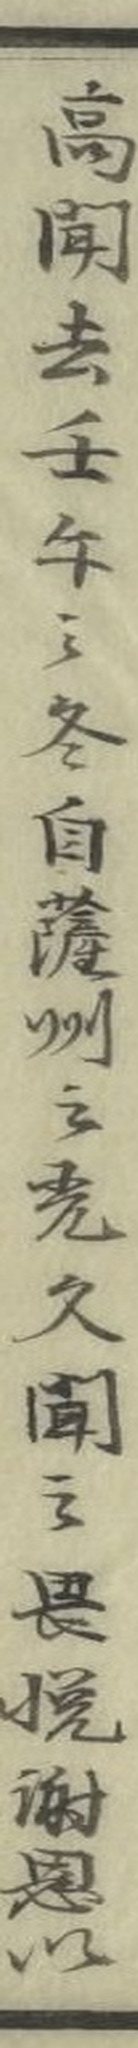高聞去壬午之冬自薩州之充久聞之畏悦謝恩以
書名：琉球往来（上）
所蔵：University of the Ryukyus Library
